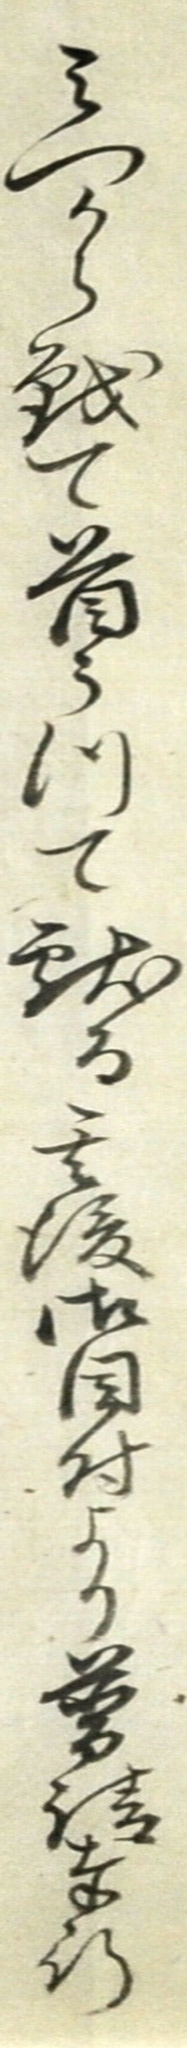みつから戦て首うつて献る其後御目付より普請奉行
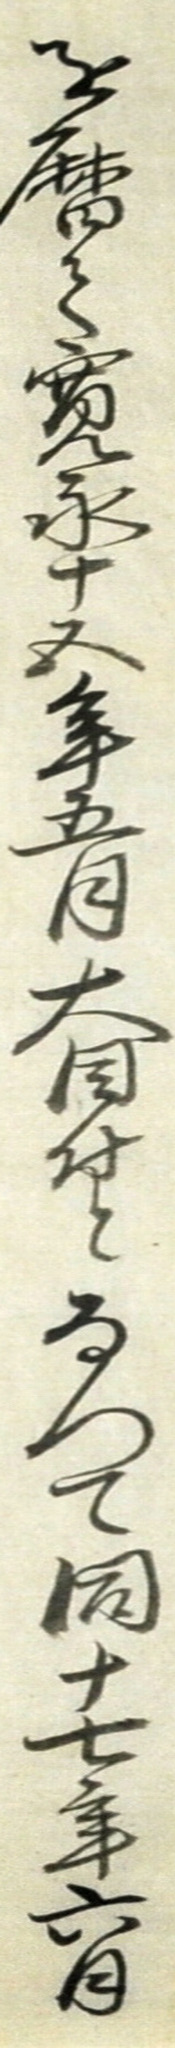を暦て寛永十五年五月大目付となつて同十七年六月
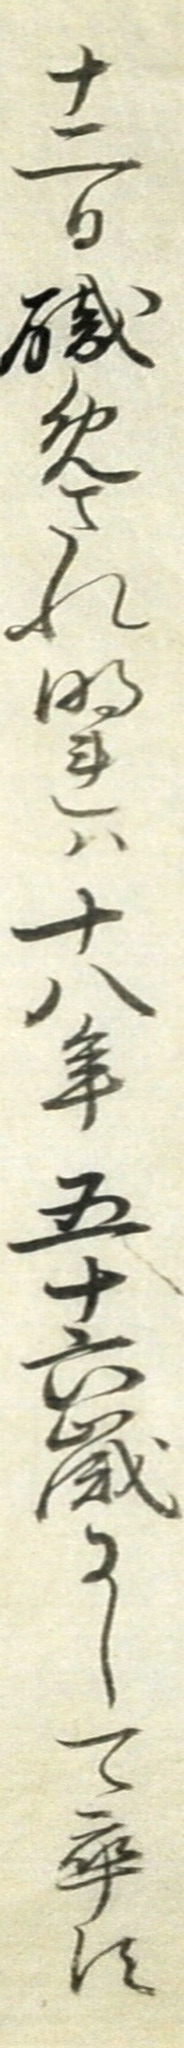十二日職免され明れは十八年五十六歳にして卒す
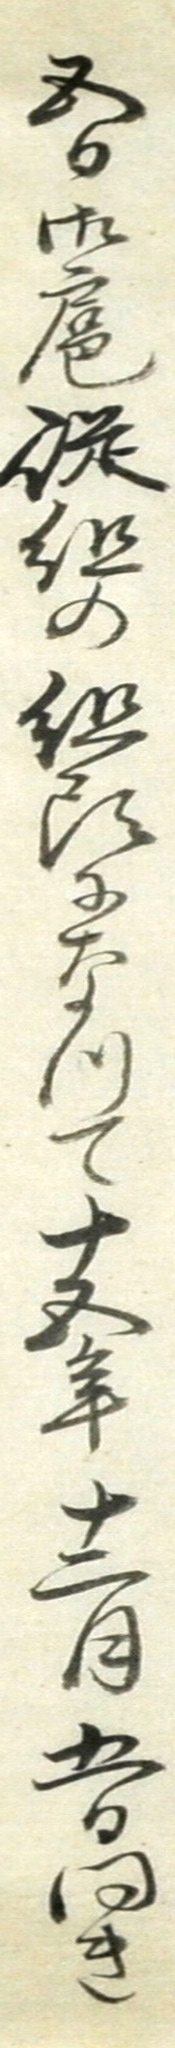五日御扈従組の組頭になつて十五年十二月五日同き
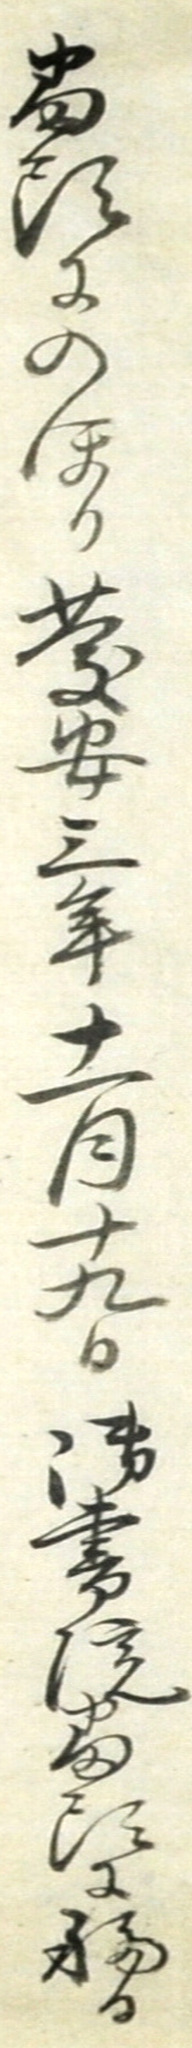番頭にのほり慶安三年十一月十九日御書院番頭に移る
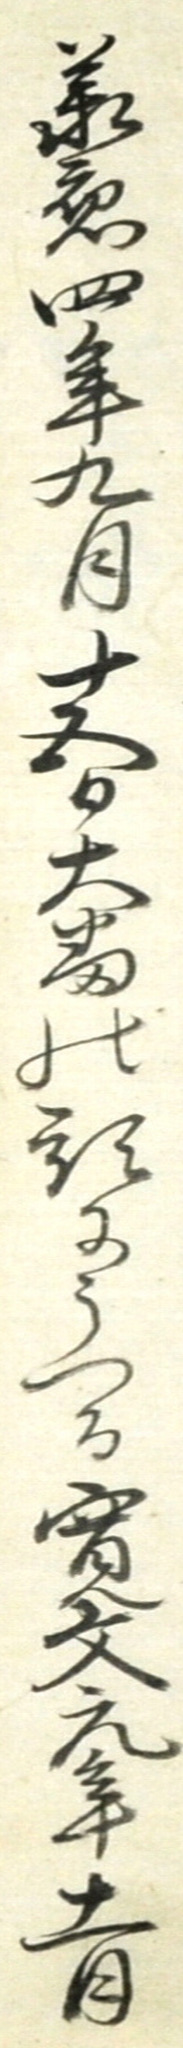承応四年九月十五日大番の頭にうつる寛文元年十一月
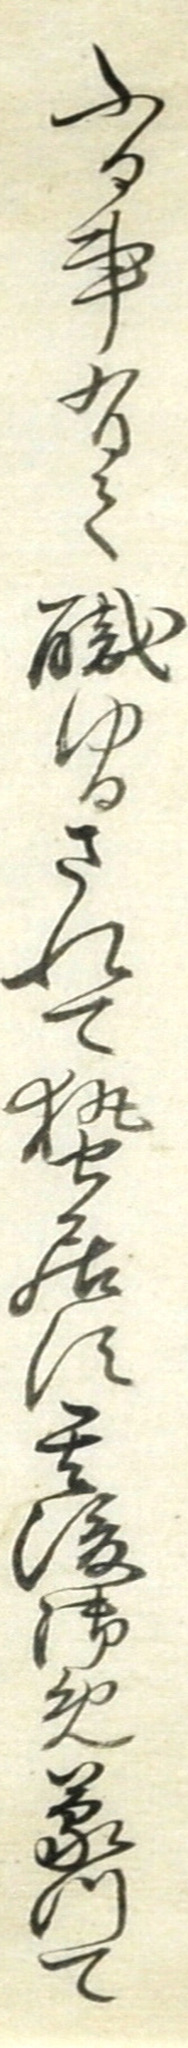ふる事有て職ゆるされて蟄居す其後御免蒙つて
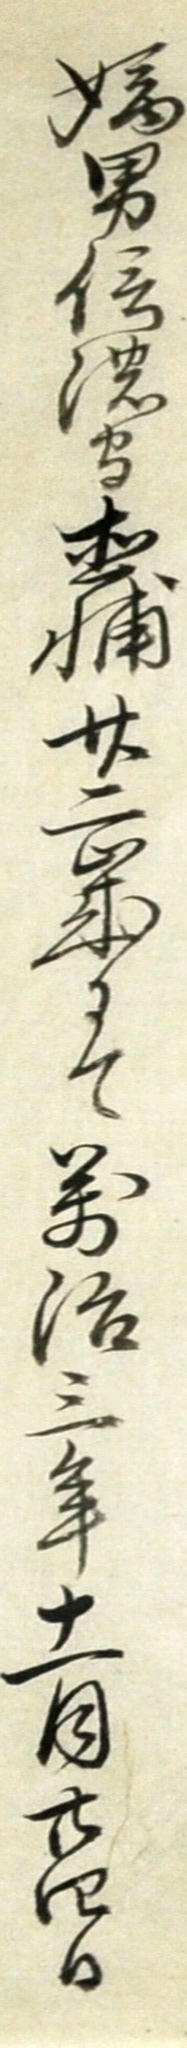嫡男信濃守直輔廿二歳にて万治三年十一月廿四日
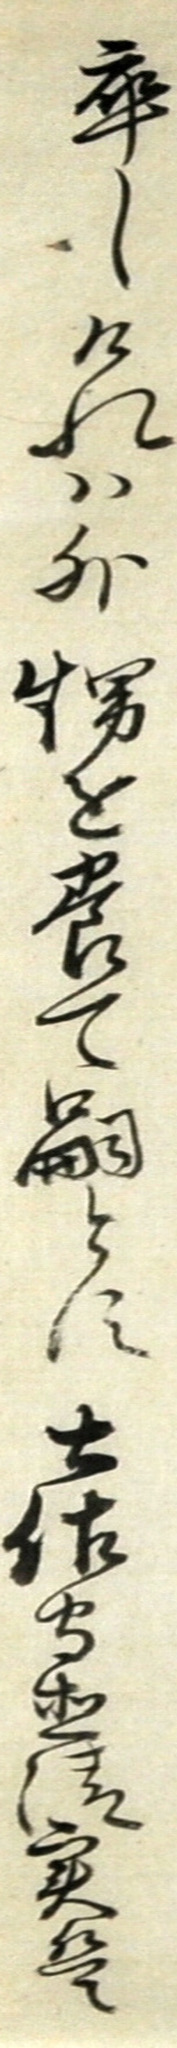卒しけれは外甥を養て嗣とす土佐守直清実是

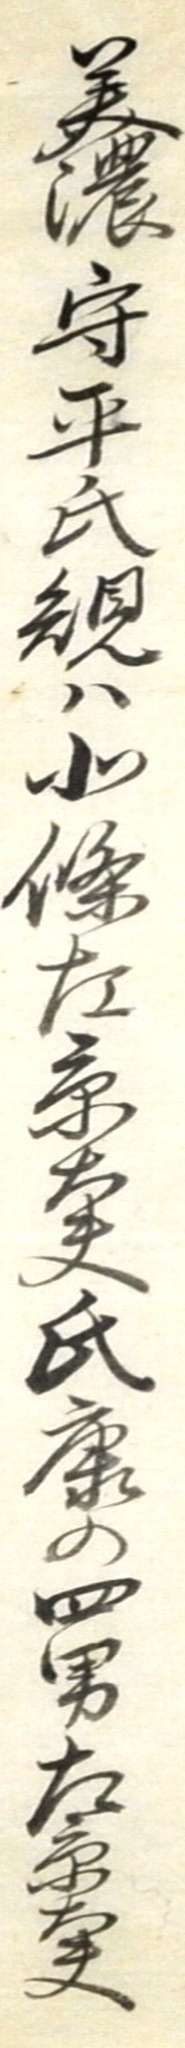美濃守平氏規は北条左京大夫氏康の四男左京大夫
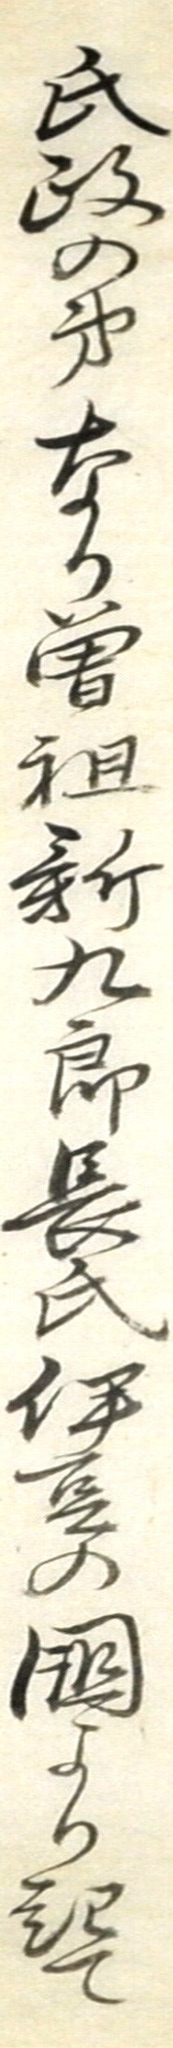氏政の弟なり曾祖新九郎長氏伊豆の国より起て

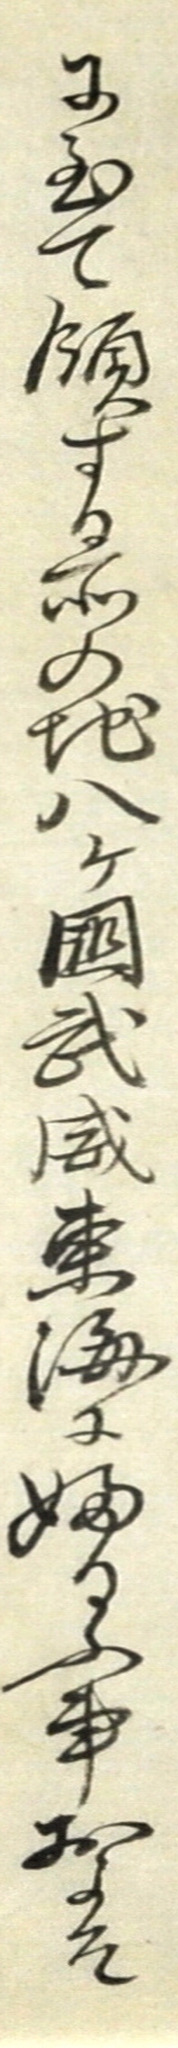に至て領する所の地八ヶ国武蔵東海にふるふ事およそ
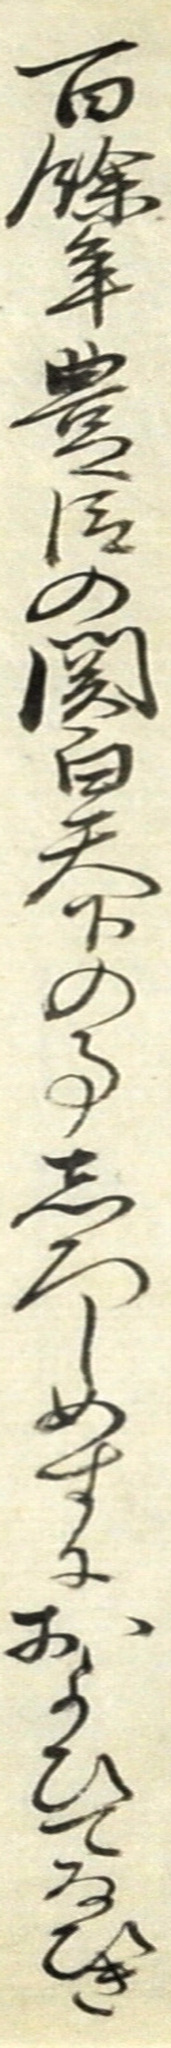百余年豊臣の関白天下の事しろしめすにおよひてなひき
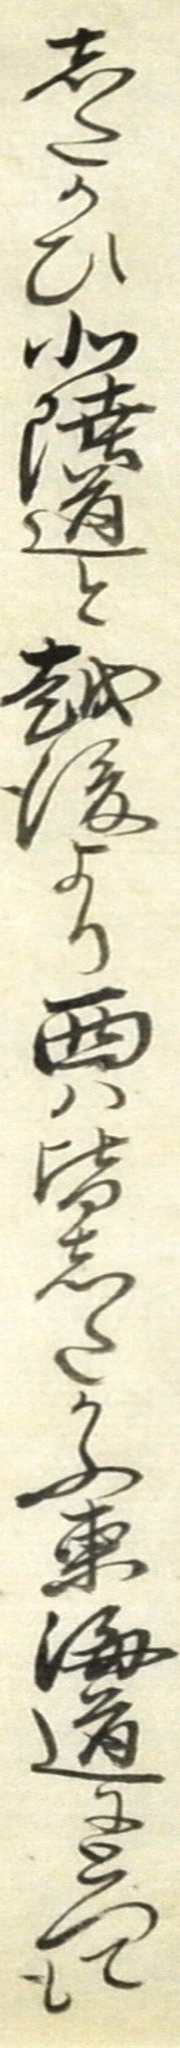したかひ北陸道と越後より西は皆したかふ東海道にとつても
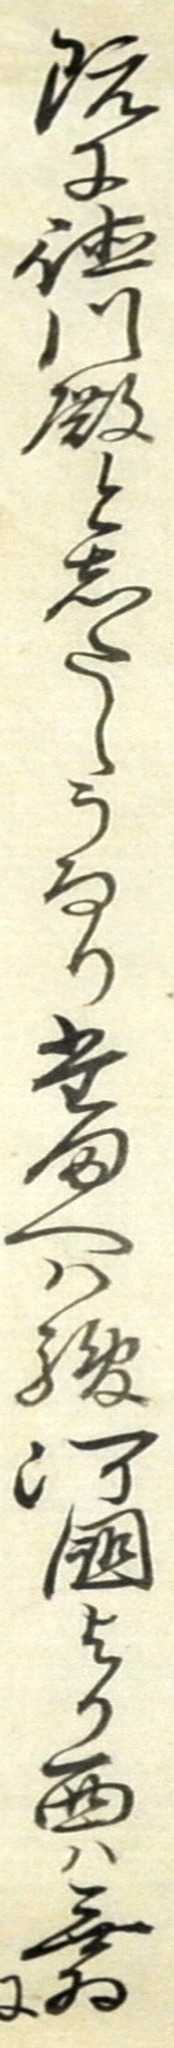既に徳川殿としたしうなりたまへは駿河国より西は無為に
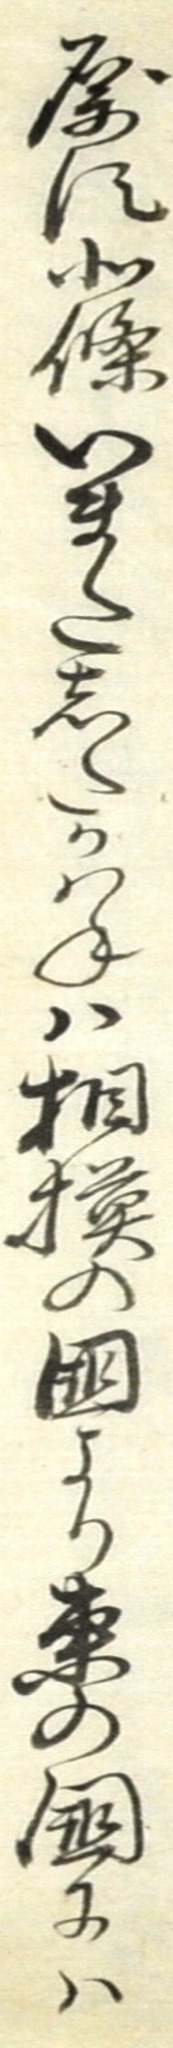属す北条いまたしたかはねは相模の国より東の国には
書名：藩翰譜（六）
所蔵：伊那市立高遠町図書館・合同会社AMANE
